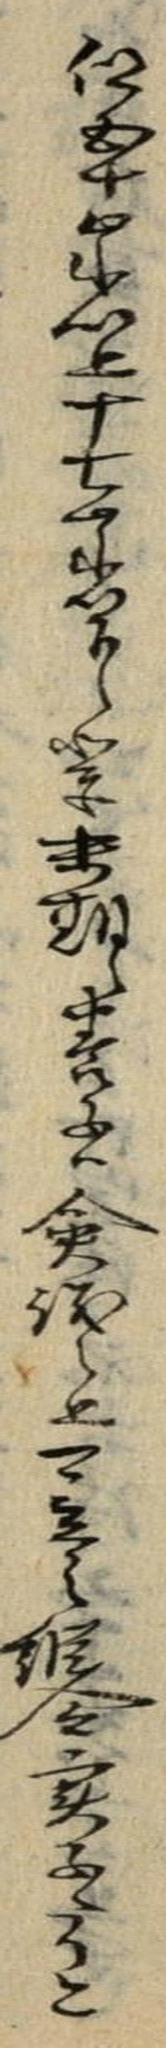但五十歳以上以下之輩末期之養子ハ僉議之上可立之仮令実子たりと
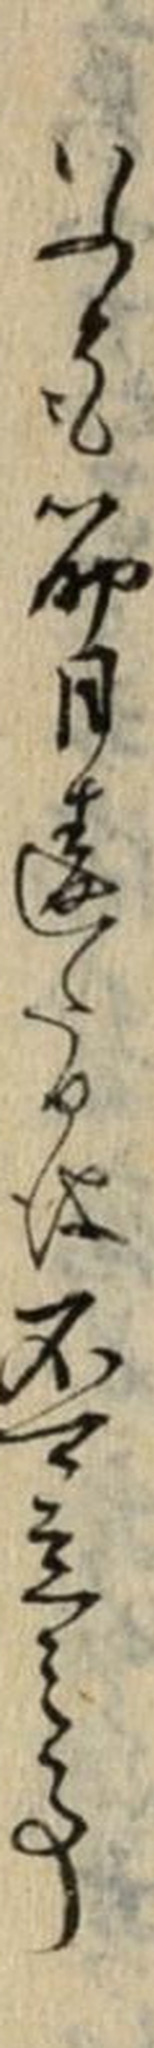いふとも筋目違たる儀不可立之事
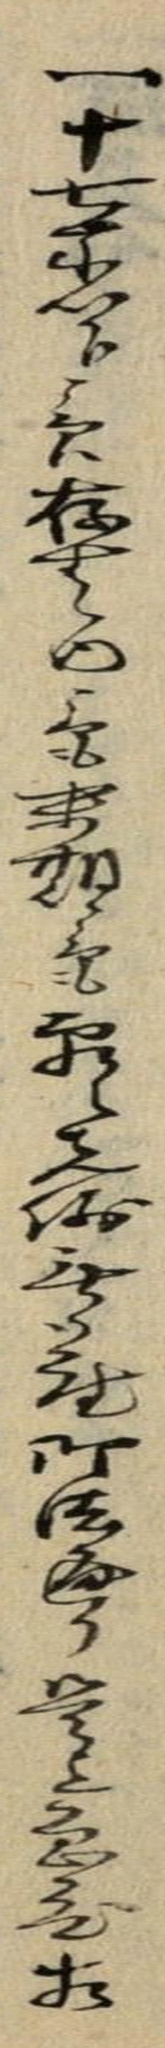一十七歳以下ニ而ハ存生之内ニ而も末期ニ而も願之先例無御座御法通り是迄急度相
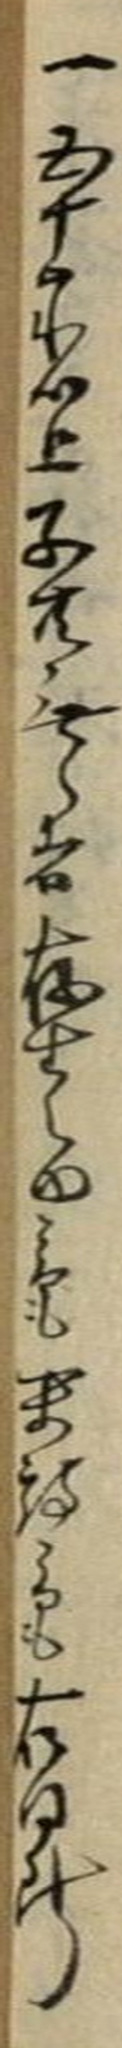一五十歳以上子供無之者存生之内ニ而も末期ニ而も右同断
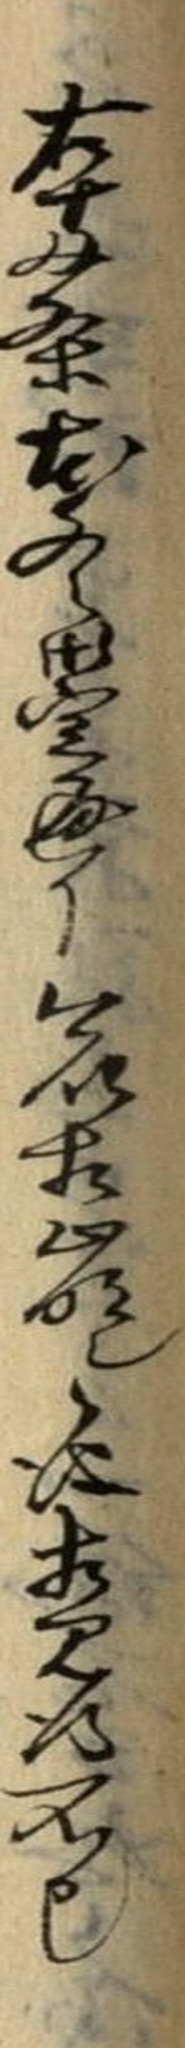右両条本文之御定通リ今以相崩シ候儀相見得不申候
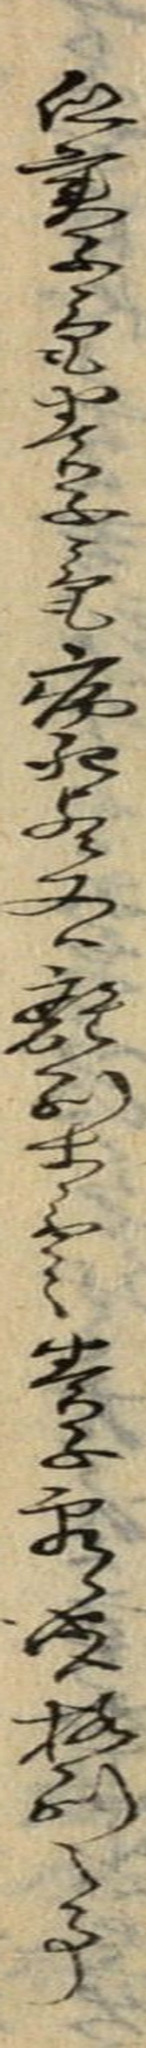但実子ニ候而も養子ニ候而も病死歟又ハ離別等ニ而之養子願候儀ハ格別之事
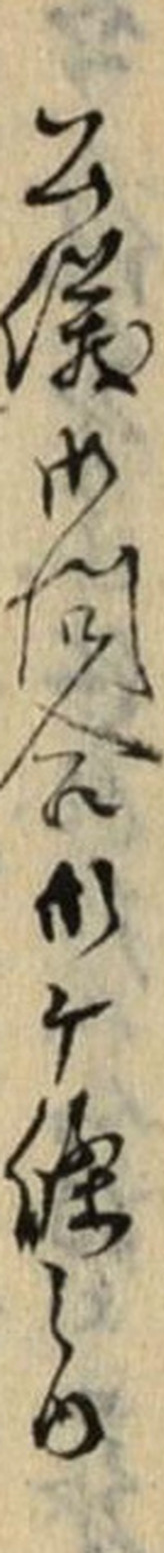公儀御問合御ヶ条之内
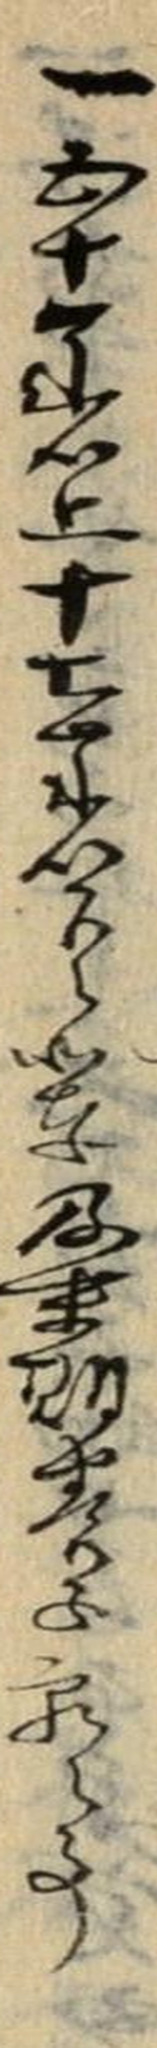一五十歳以上十七歳以下之輩及末期養子願之事
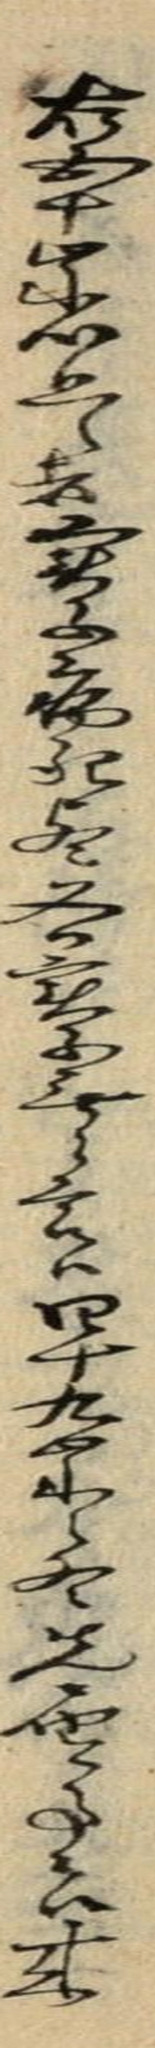右五十歳以上之者実子病死歟又ハ実子無之節ハ四十九歳之冬先届候事ニ候来
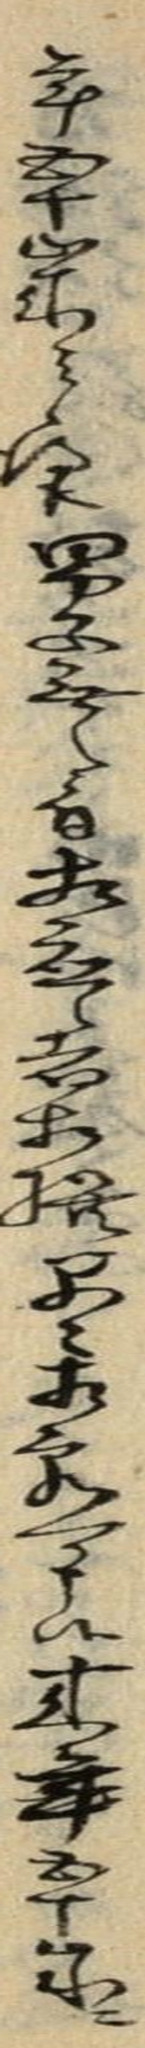年五十歳ニ候得共男子無之ニ付相応之者相撰早々相願可申候来年五十歳ニ
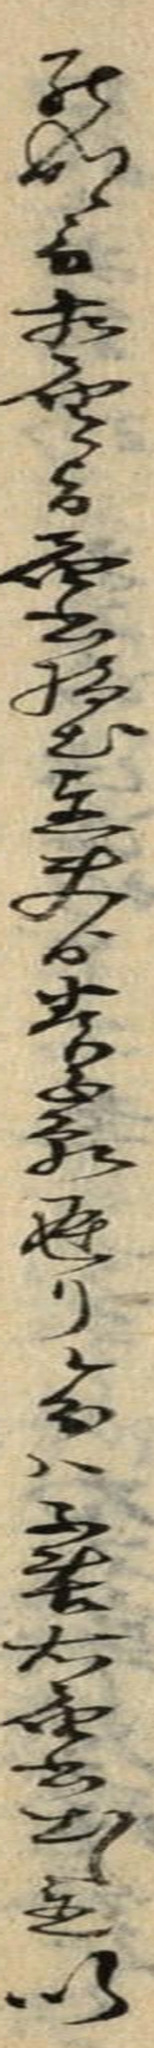罷成候二付相届候旨届書指出置夫ゟ養子願遅リ候分ハ不苦右届書出し置以
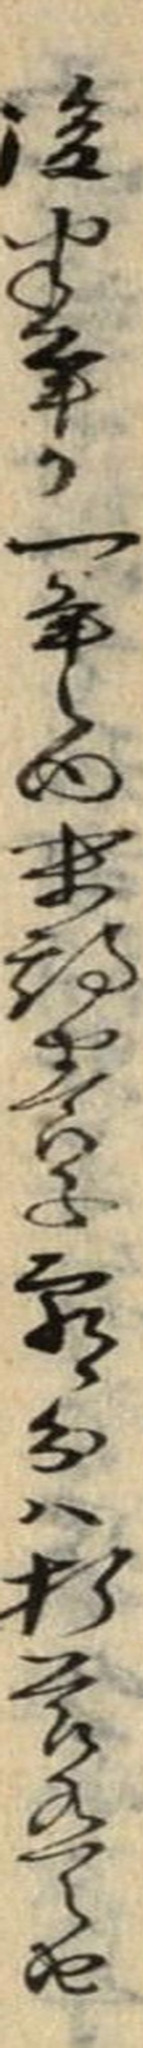後半年か一年之内末期養子願候分ハ折節有之由
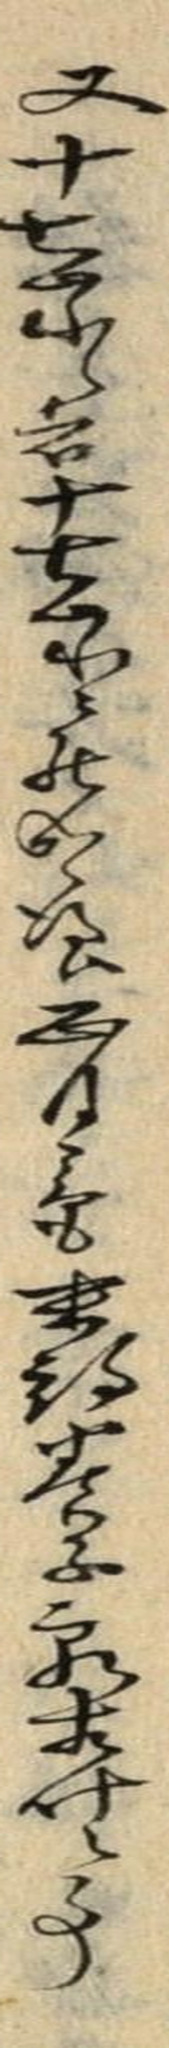又十七歳之者十七歳ニ罷成候得ハ正月ニ而も末期養子願相叶候事
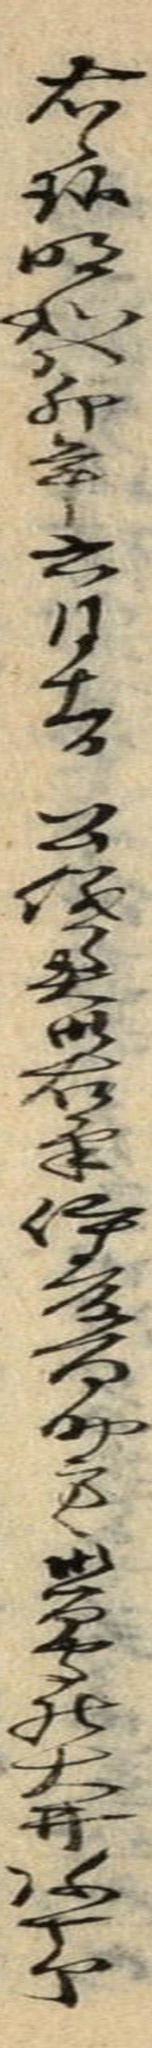右之趣明和八卯年六月十一日公儀奥御右筆伊藤百助方ヘ御留守居大井弥十郎
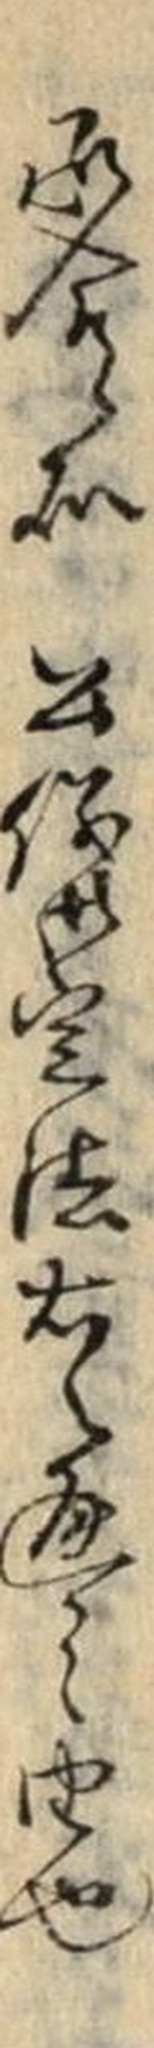承合候処公儀御定法右之通之由也
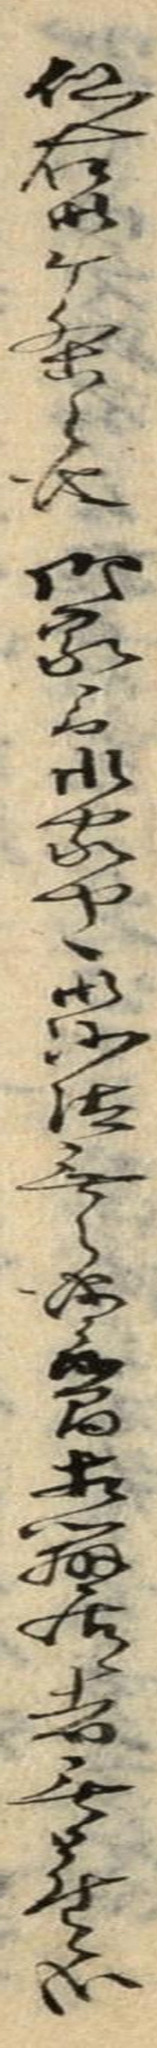但右御ヶ条之儀御家ニ而御家中ヘ御沙汰無之儀二候間相心柄居候者無御座候哉
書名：養子縁組之部
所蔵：福井県文書館 Fukui Prefectural Archives
